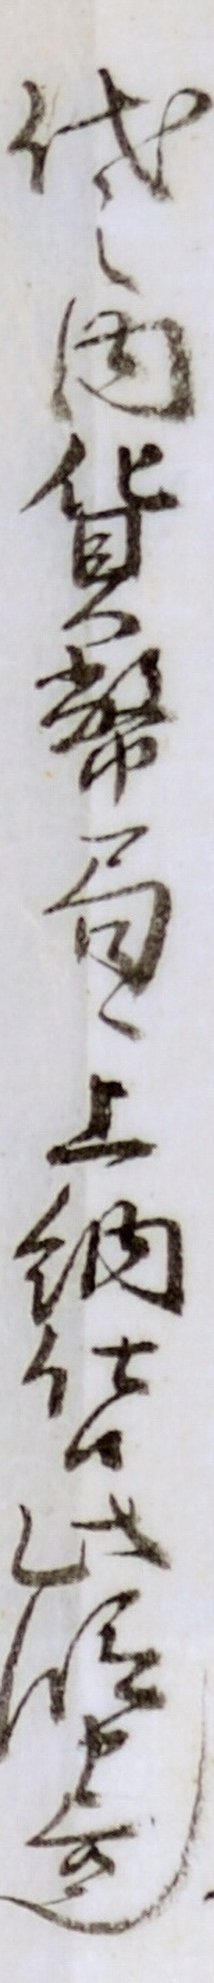代之内貨幣局へ上納仕候此段申上候也
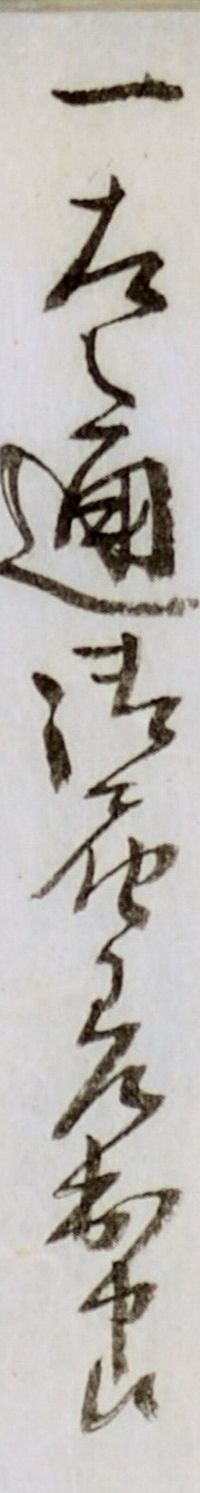一左之通御届差出申候
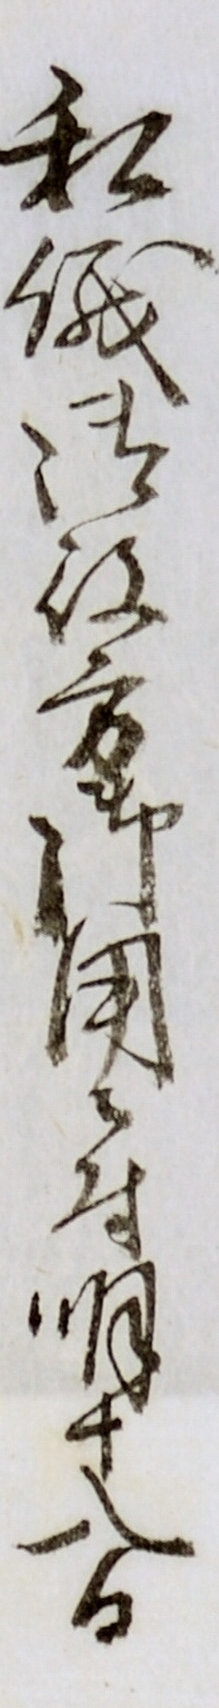私儀御役方御用に付明十八日
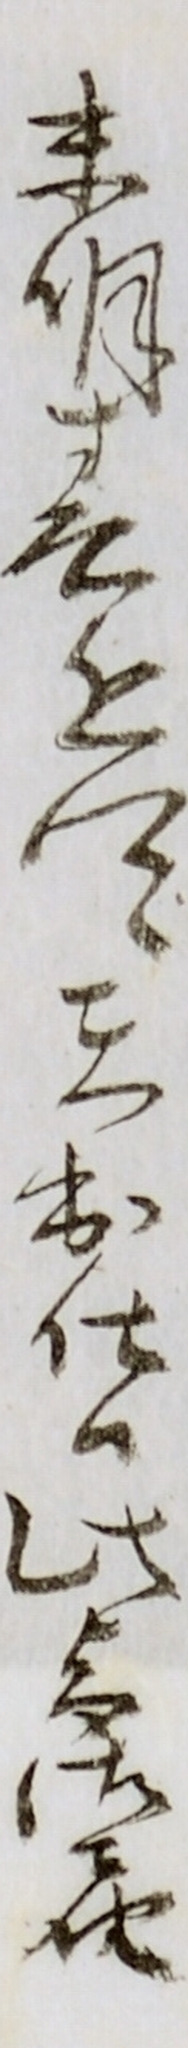未明春近郷へ在出仕候此旨御届
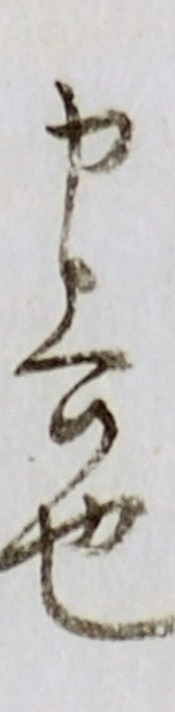申上候也
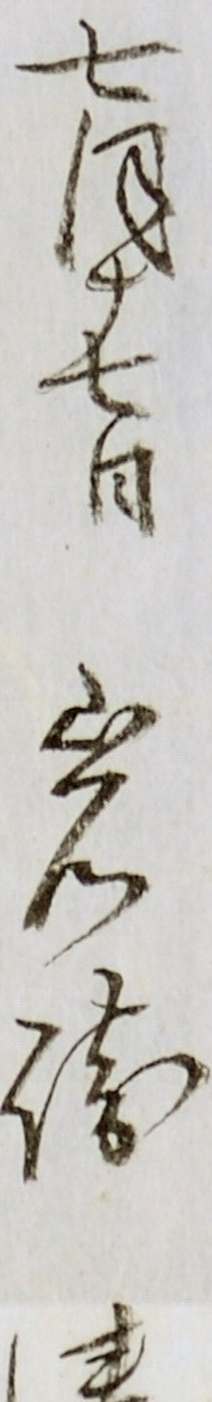七月十七日岩崎湊
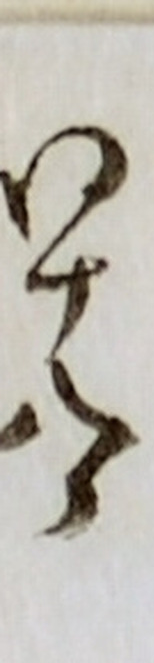同十八日
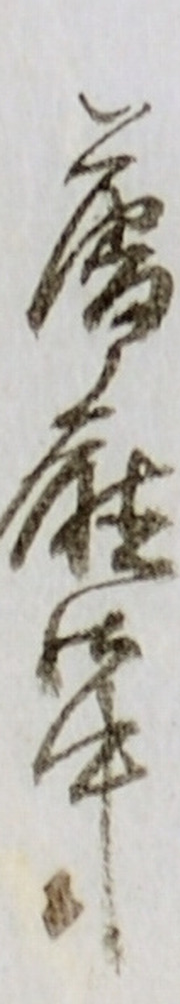藩庁御中
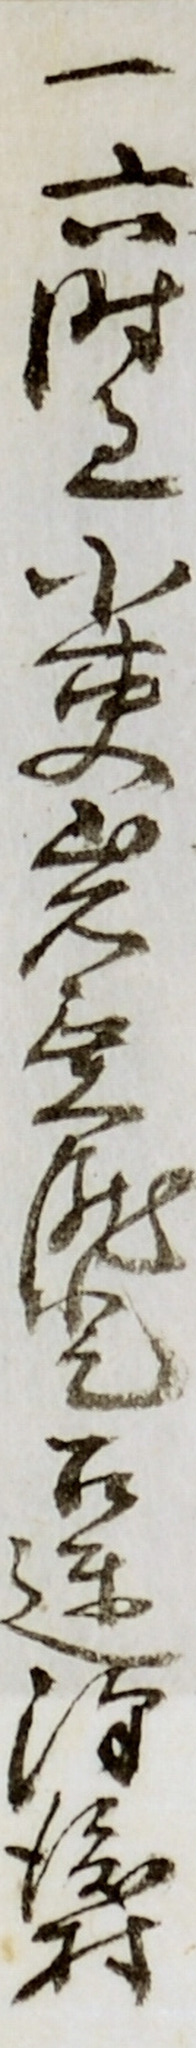一六時過小吏岩垂滝登召連沢渡村
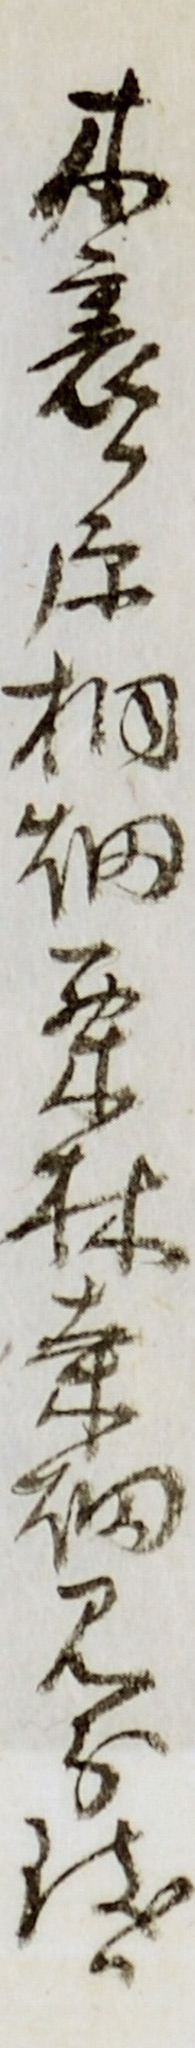木裏ヶ原桐畑栗林桑畑見分致候
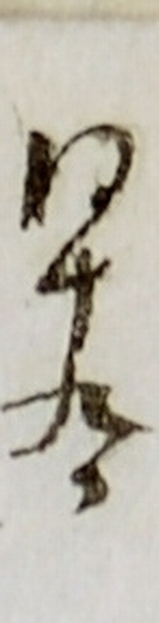同十九日
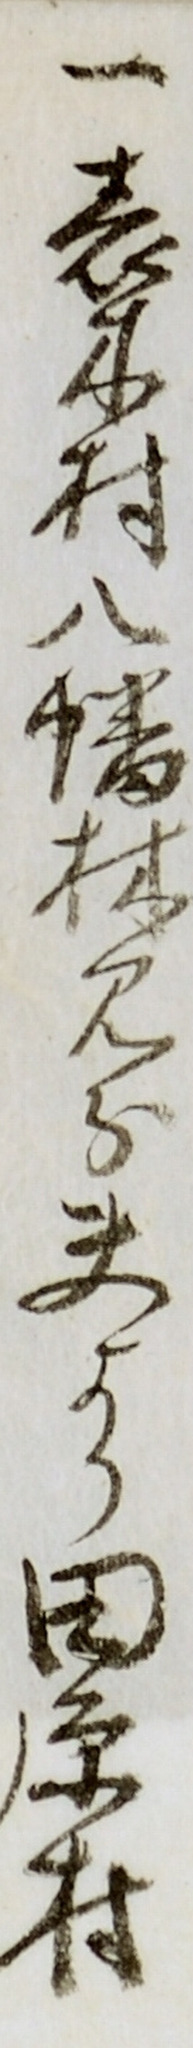一表木村八幡林見分夫より田原村
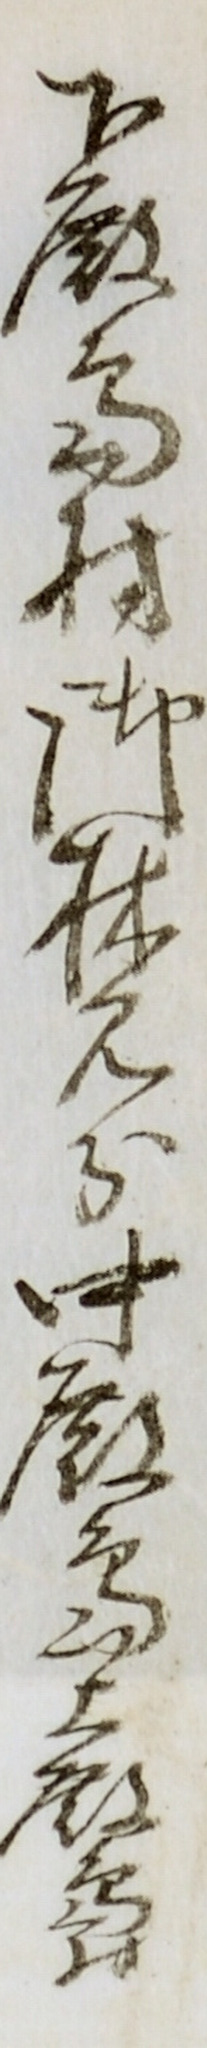下殿島村御林見分中殿島上殿島村
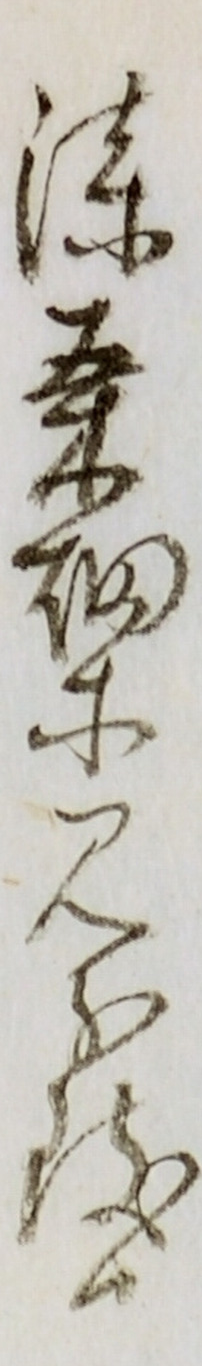漆桑畑等見分致候
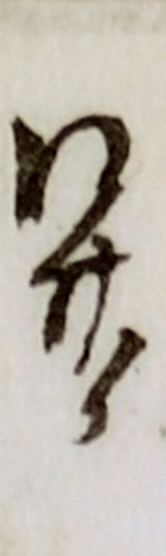同廿一日
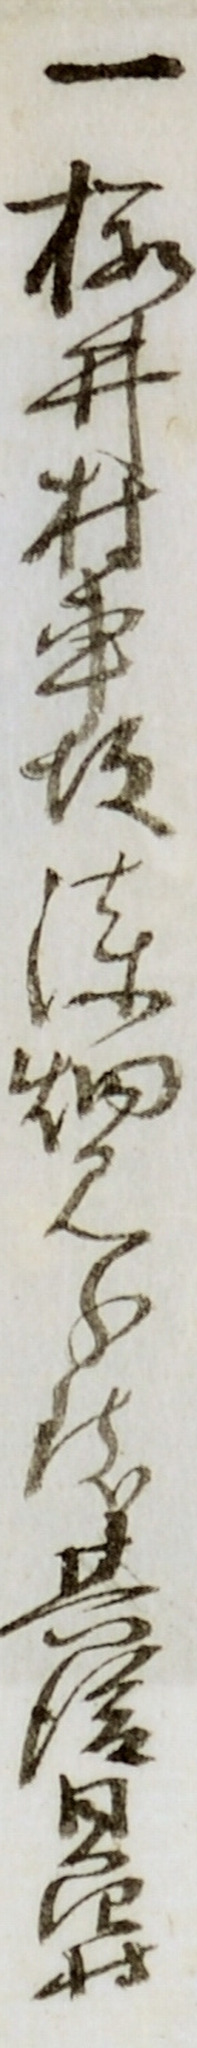一桜井村車坂漆畑見分致其後貝沼村
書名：山林方諸事御用留
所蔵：伊那市立高遠町図書館・合同会社AMANE
